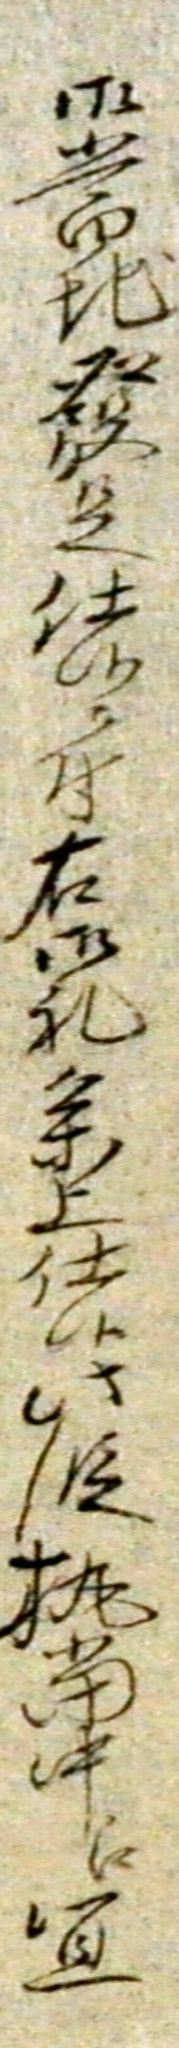御当地発足仕候ニ付右御礼参上仕候此段執當中江宜
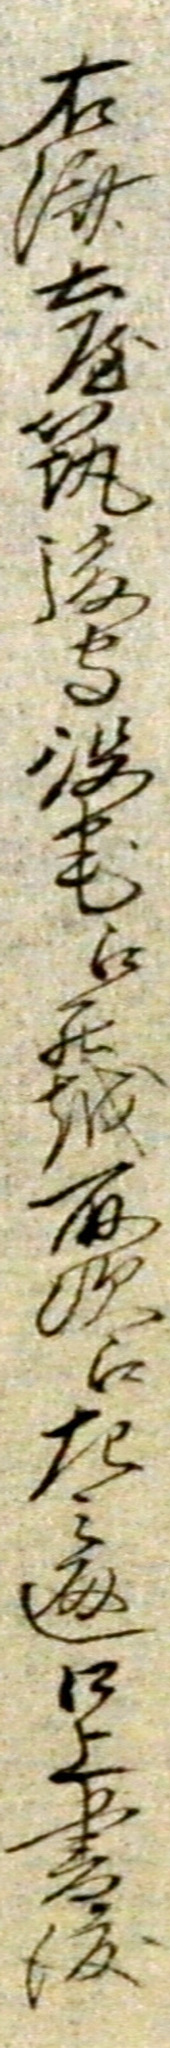右済土屋筑後守役宅江罷越取次江左之通口上書渡
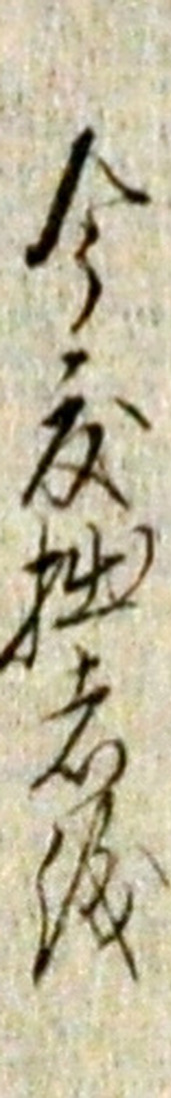今度拙者儀
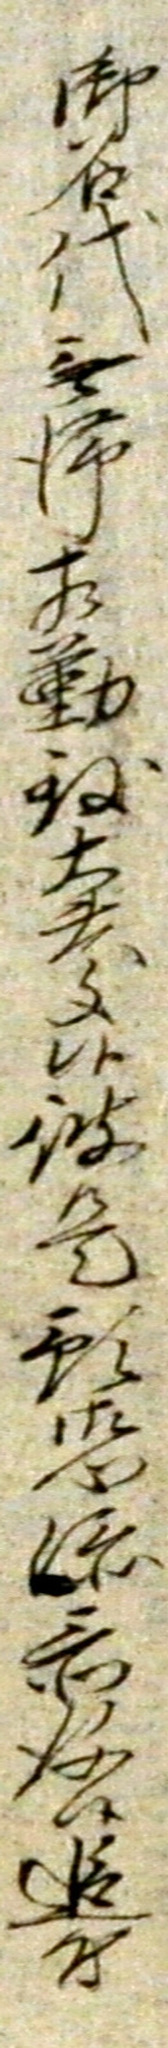御名代無滞相勤致候彼是預御心添忝存候追付
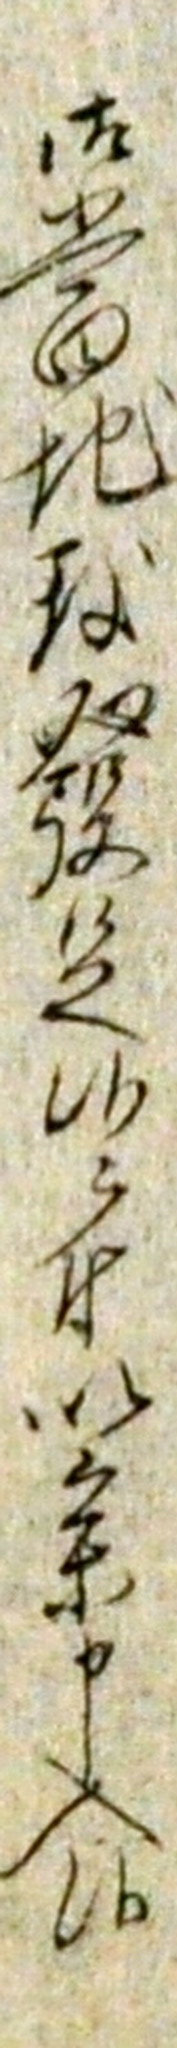御当地致発足候ニ付以参申入候
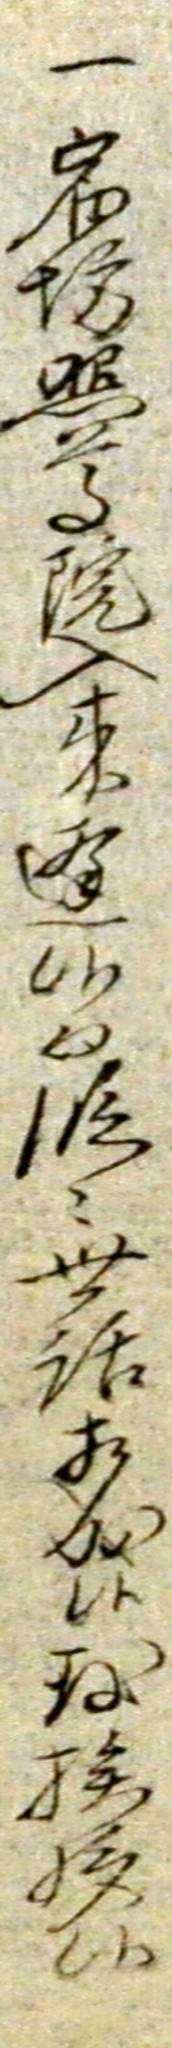一宿坊照尊院入来逢候而段々世話相成候致挨拶候
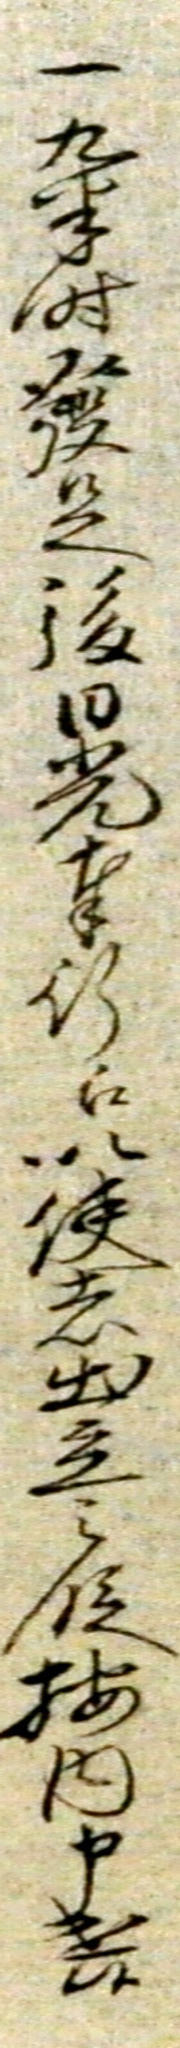一九半時発足後日光奉行江以使者出立之段按内申遣候
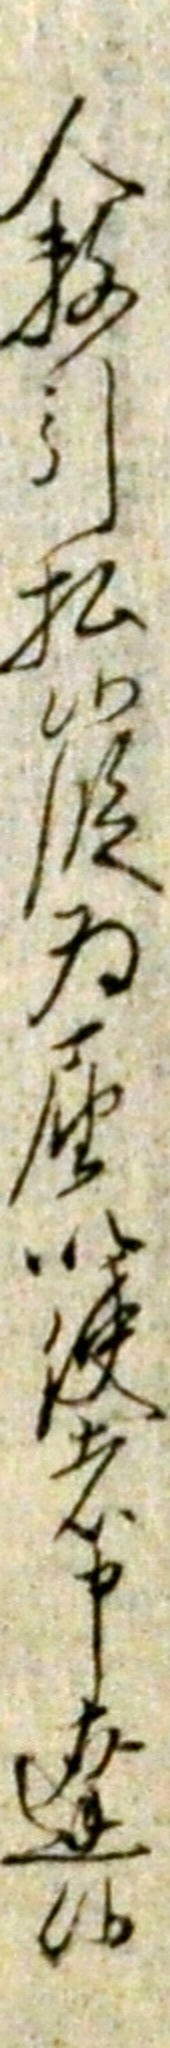人数引払候段為届以使者申達候
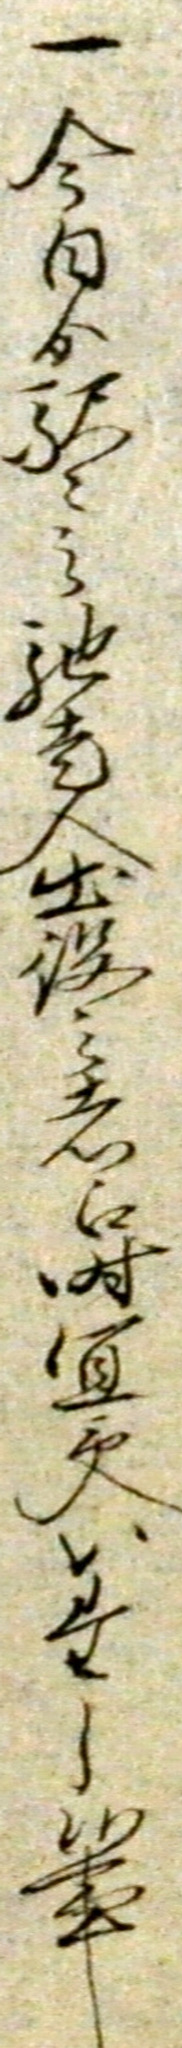一今日ゟ駅々之馳走人出役之者江時宜受いたし候事
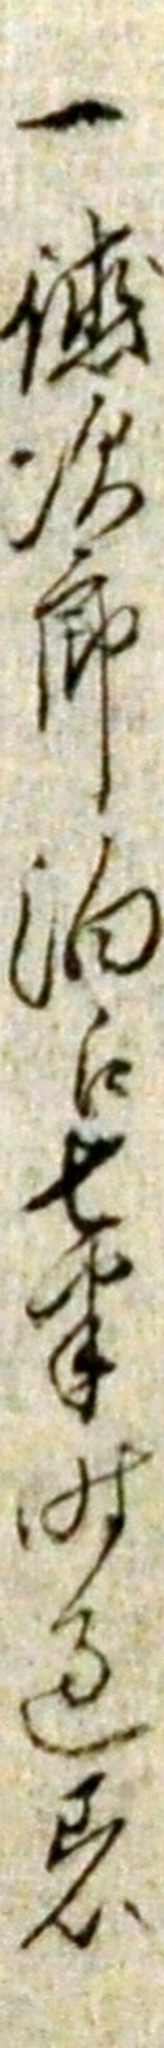一徳次郎泊江七半時過着
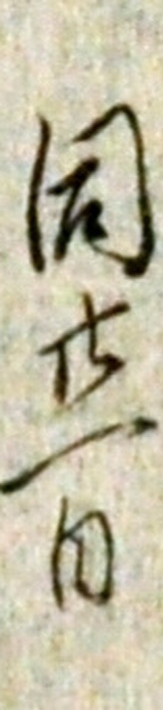同廿一日
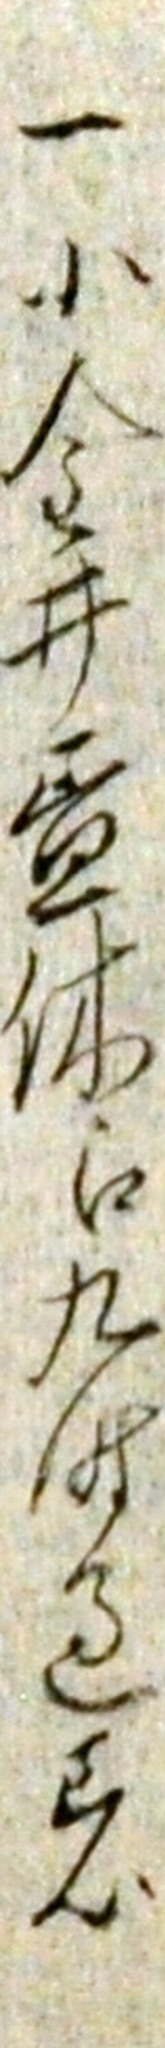一小金井昼休江九時過着
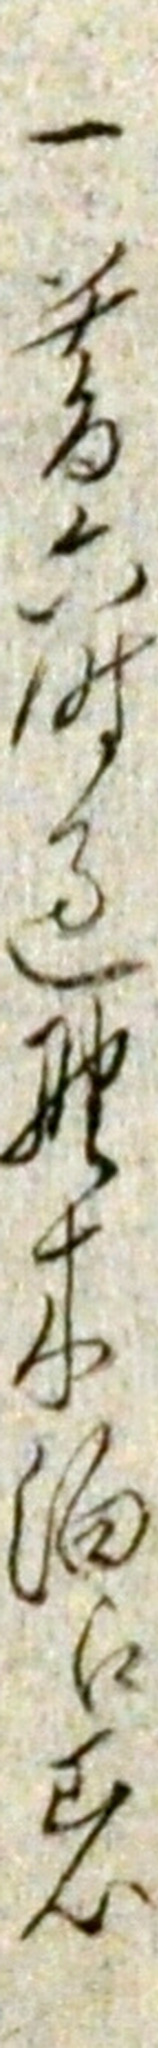一暮六時過野木泊江着
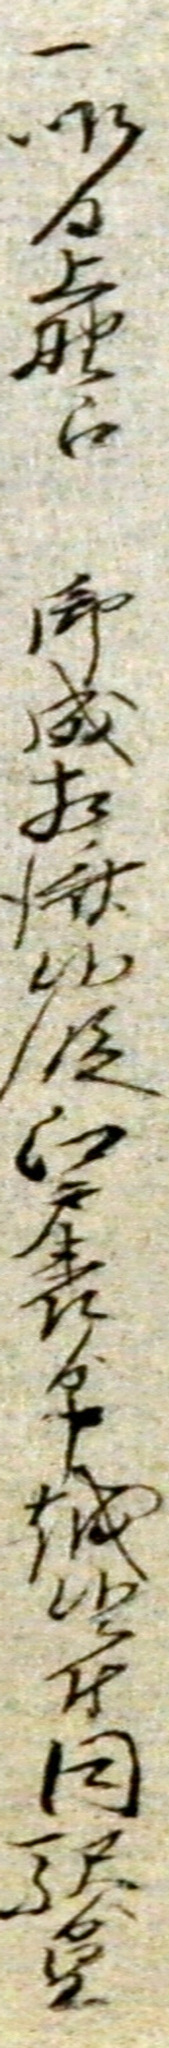一昨日上野江御成相済候段江戸表ゟ申越候二付同駅ゟ口上

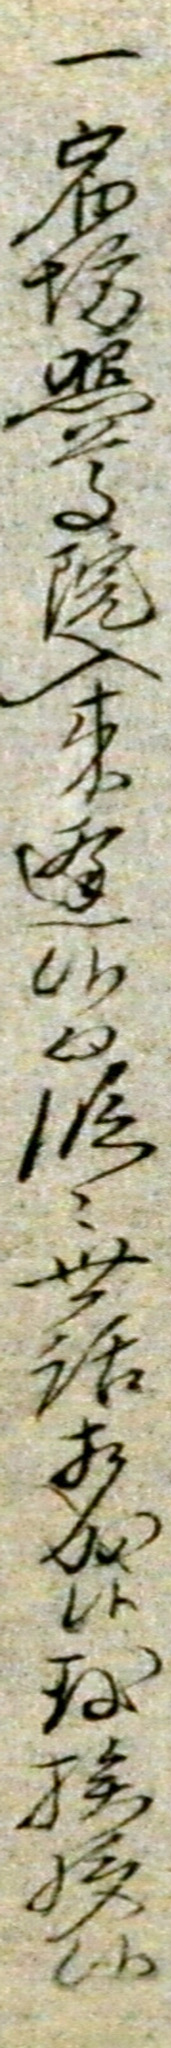一宿坊照尊院入来逢候而段々世話相成候致挨拶候
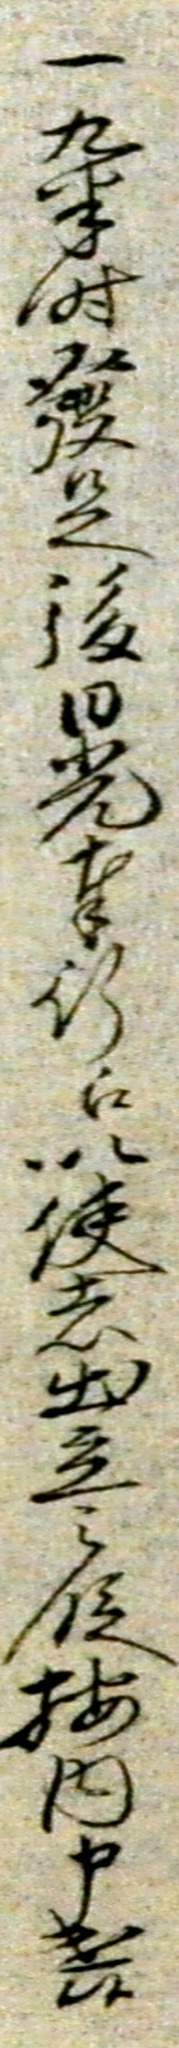一九半時発足後日光奉行江以使者出立之段按内申遣候
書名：日光御名代相勤候節ノ留
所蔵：伊那市立高遠町図書館・合同会社AMANE
